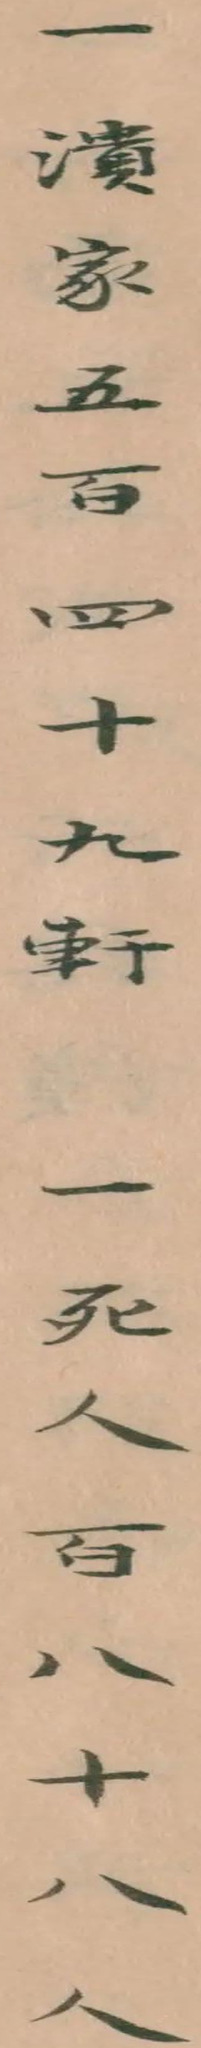一潰家五百四十九軒一死人百八十八人
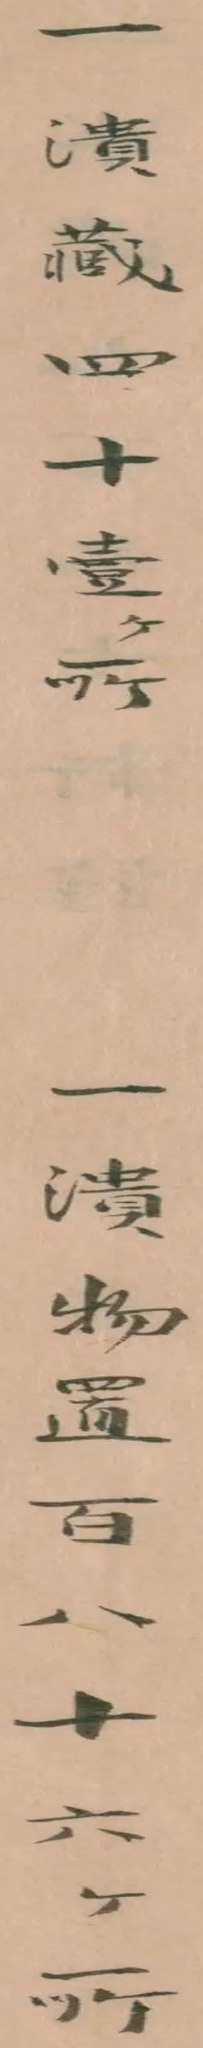一潰藏四十壹ケ所一潰物置百八十六ケ所
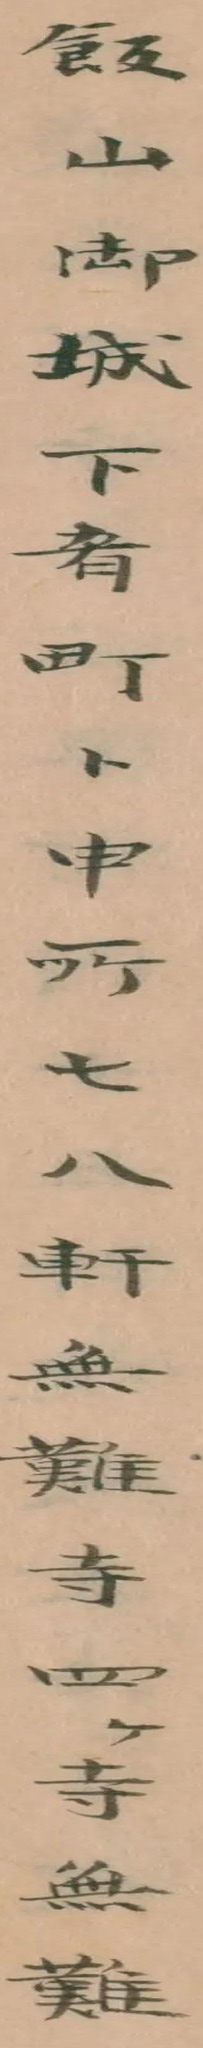飯山御城下肴町ト申所七八軒無難四ケ寺無難
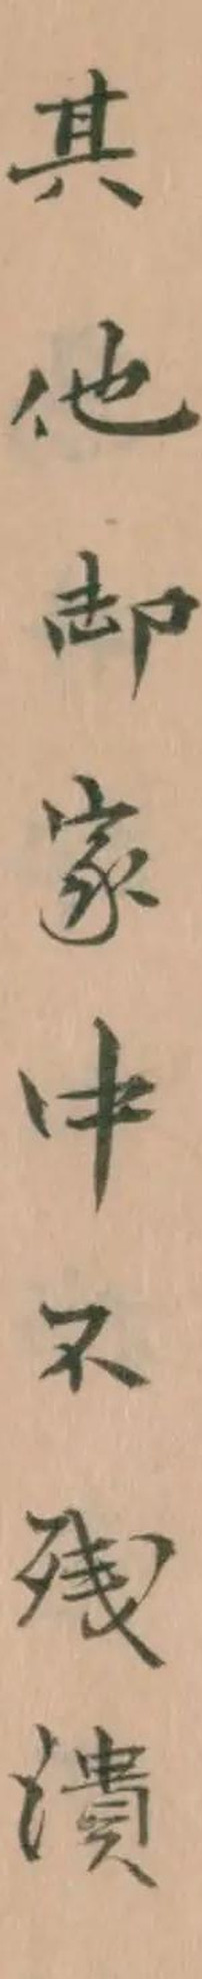其他御家中不残潰れ
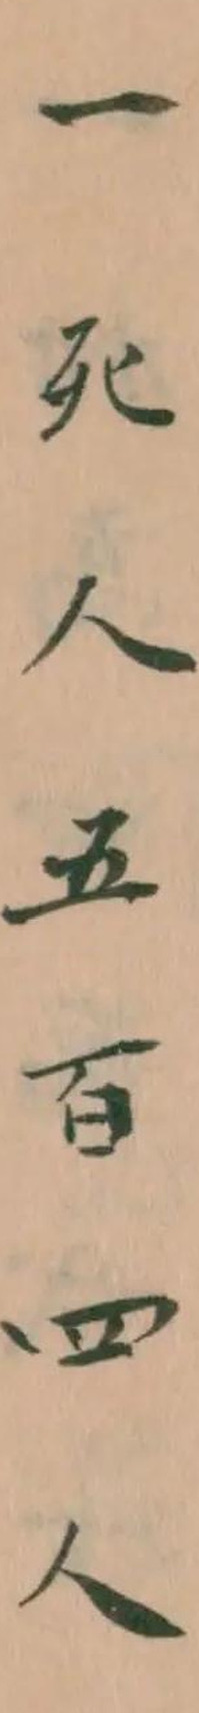一死人五百四人
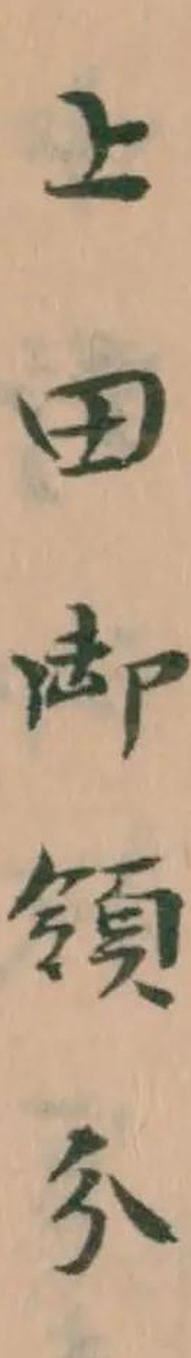上田御領分
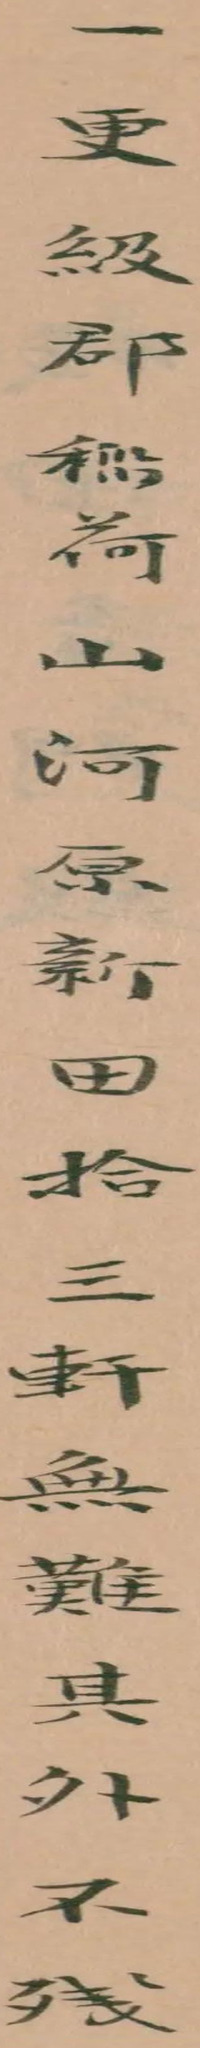一更級郡稲荷山河原新田拾三軒無難其外不残
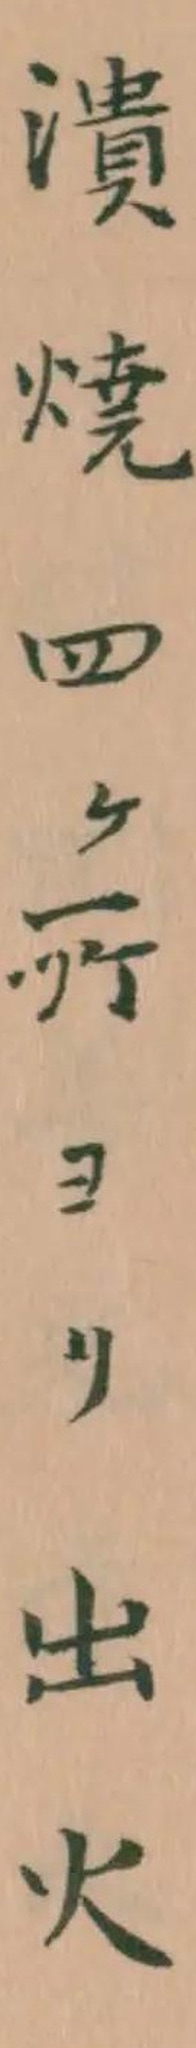潰焼四ヶ所ヨリ出火
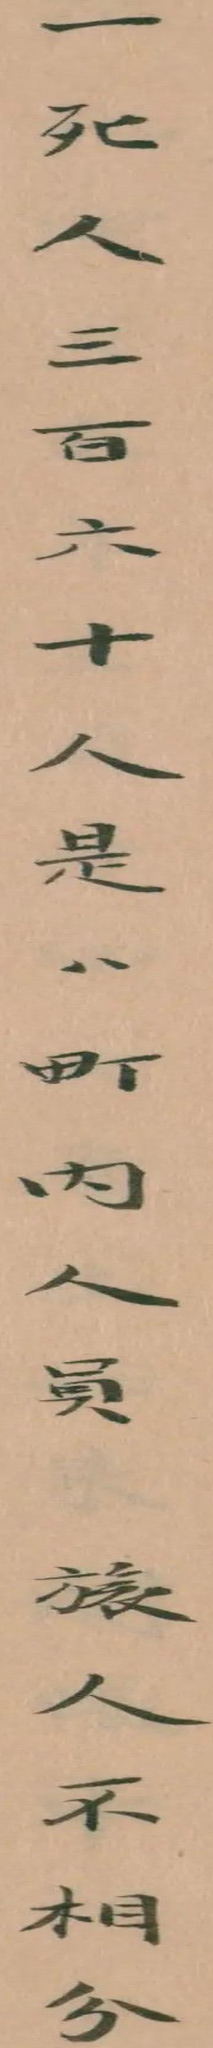一死人三百六十人是ハ町内人員旅人不相分
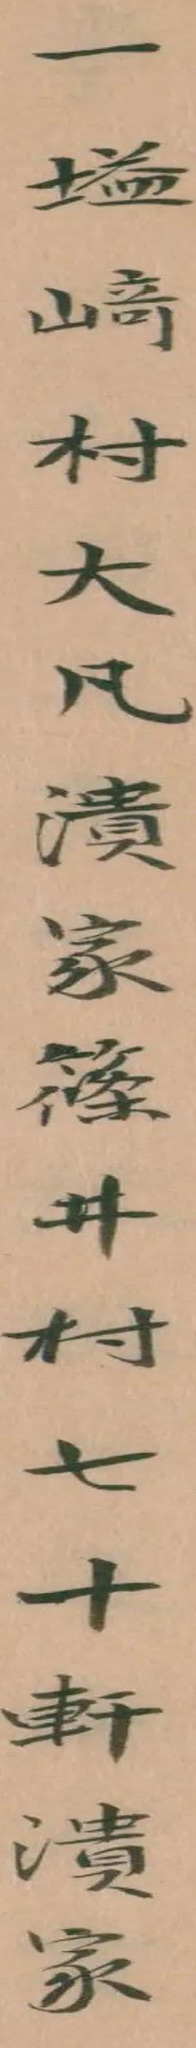一塧崎村大凡潰家篠井村七十軒潰家
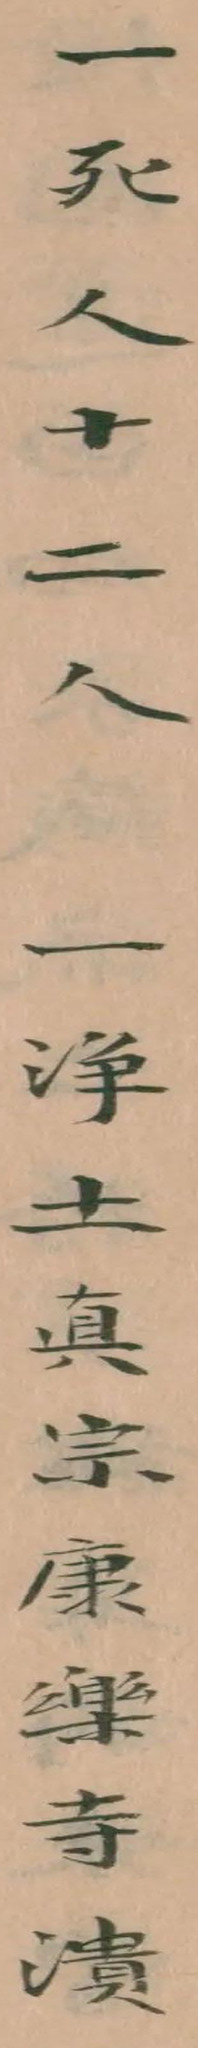一死人十二人一浄土真宗康楽寺潰
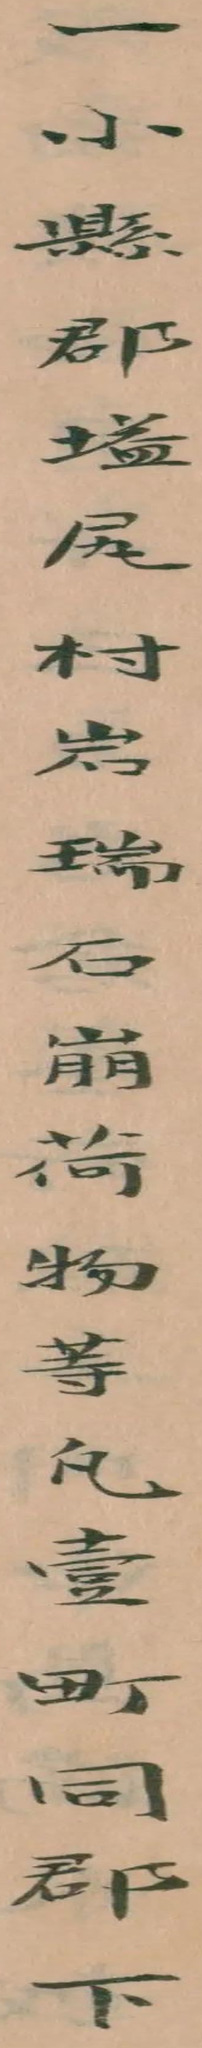一小縣郡塧尻村岩端石崩荷物等凡壹町同郡下
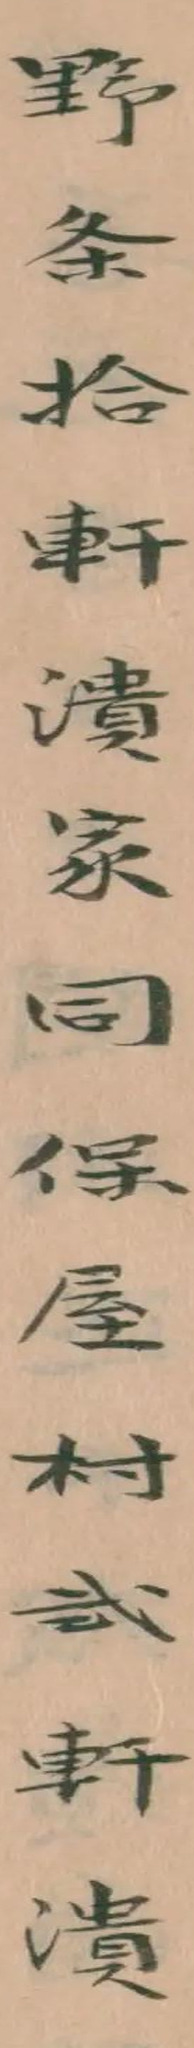野条拾軒潰家同保屋村弐軒潰
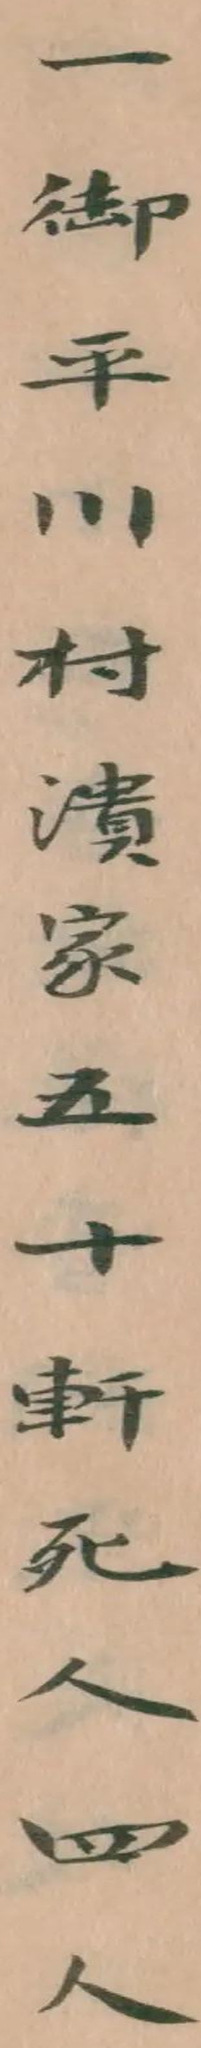一御平川村潰家五十軒死人四人
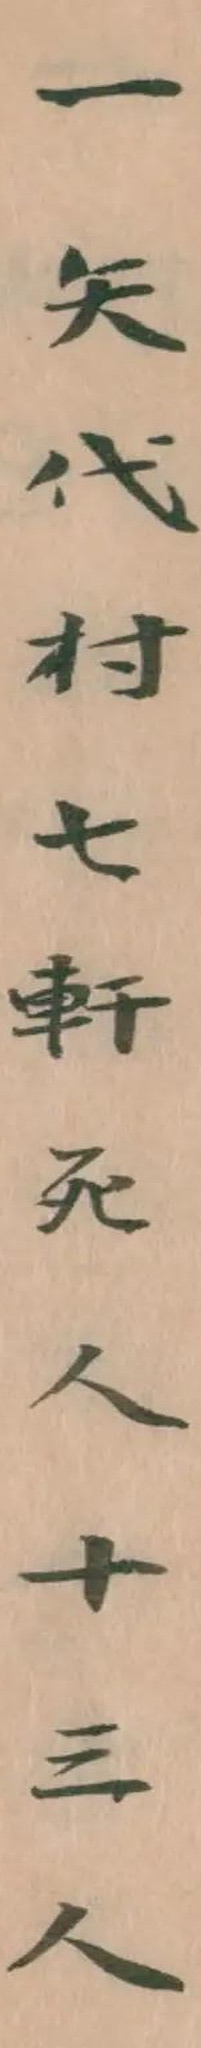一矢代村七軒死人十三人
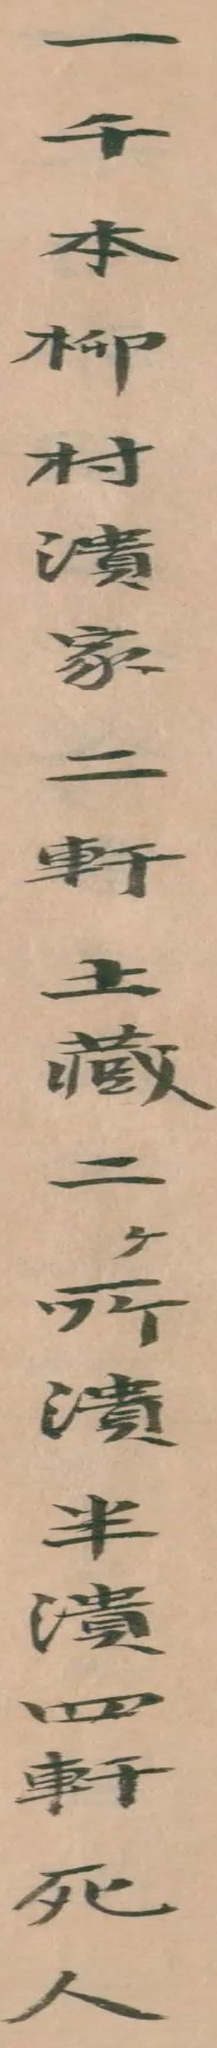一千本柳村潰家二軒土藏二ヶ所潰半潰四軒死人
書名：地災撮要. 巻5-6(地震之部)
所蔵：国立国会図書館 National Diet Library, JAPAN
